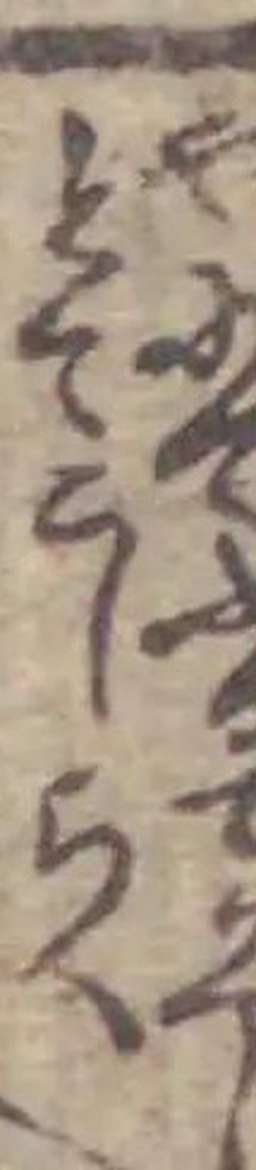とてこしらへ
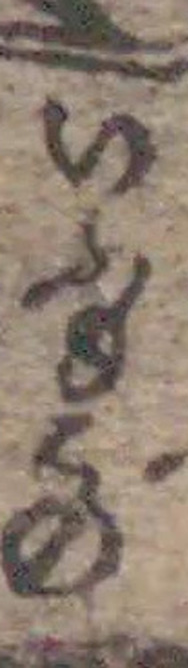いふもこの
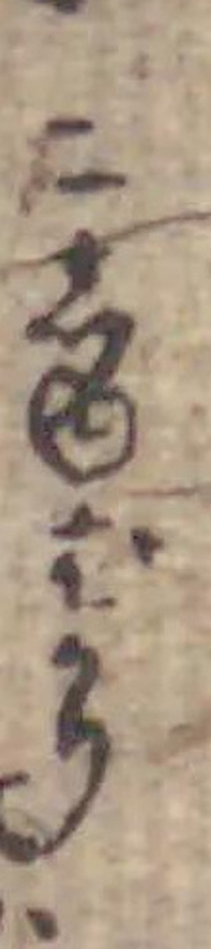こしゆばかり
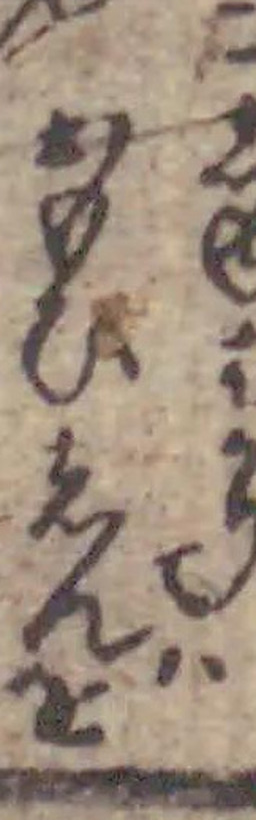おもひしんを
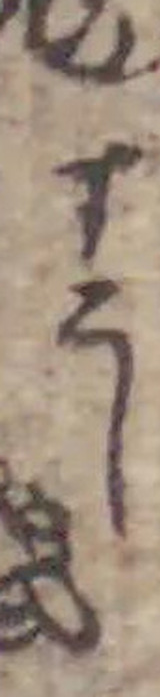すこし
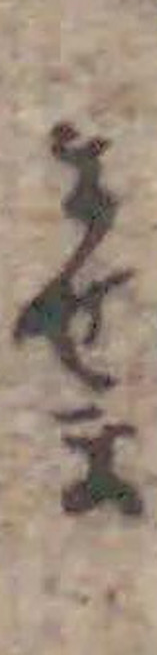ませま
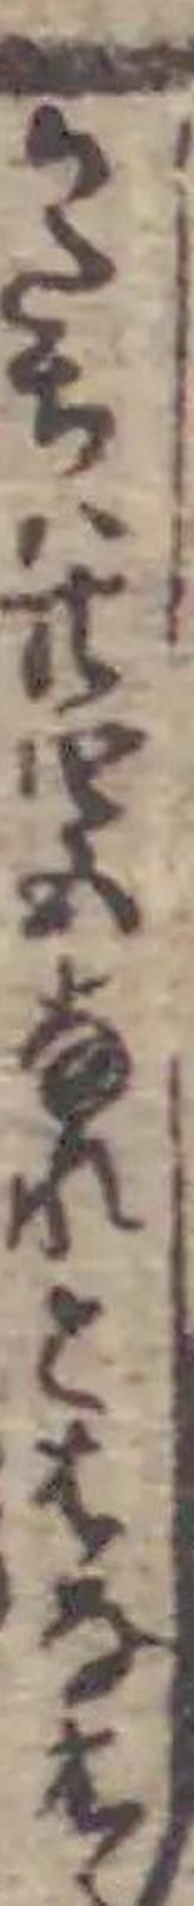かたちは廿四五なれとはなはた
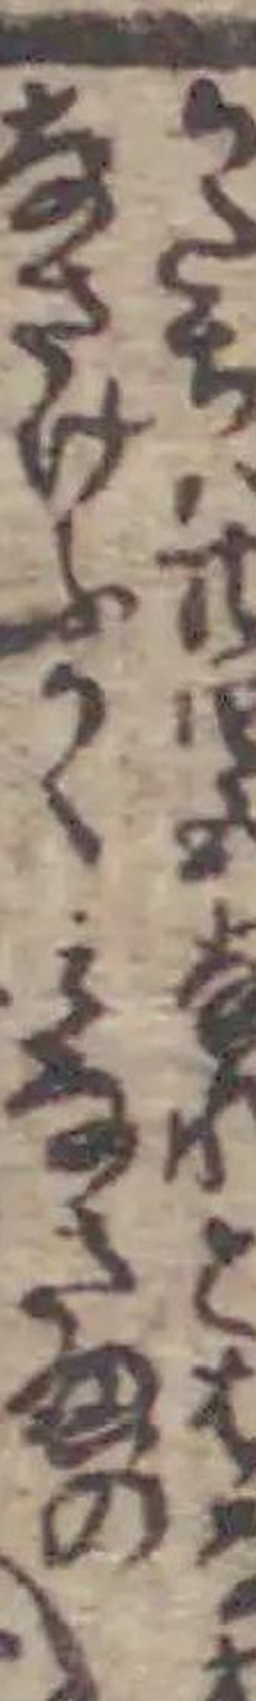なさけふかくみなさまの
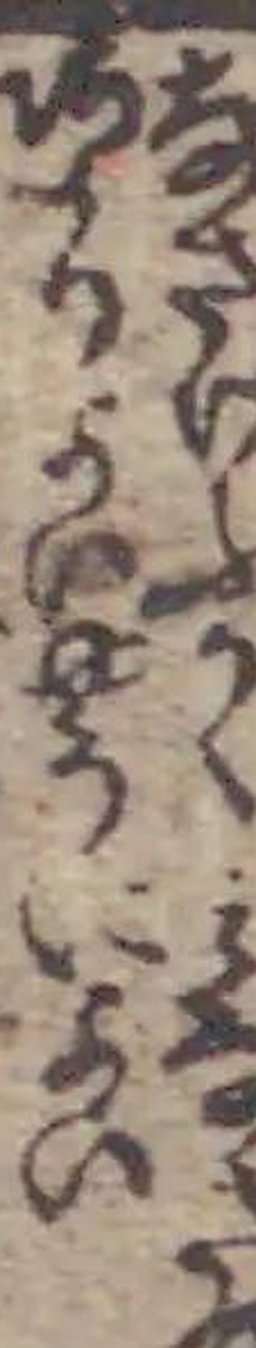あかりよいやうによい
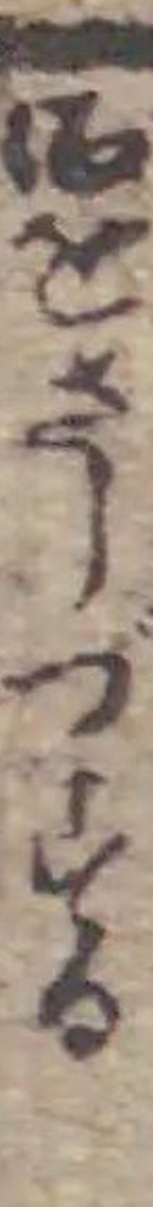酒をさしづする

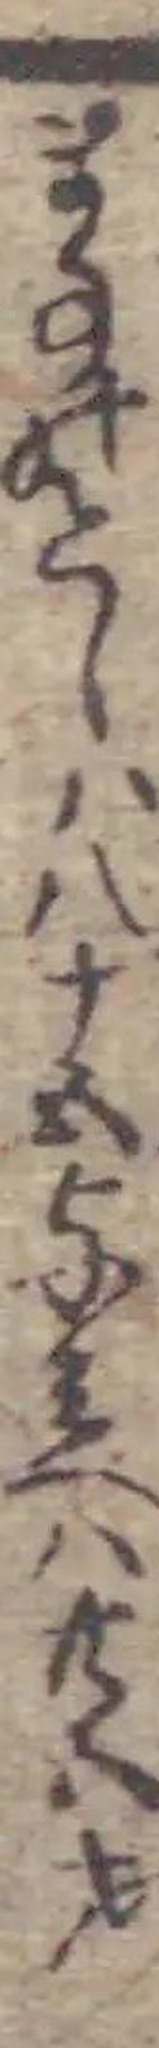ま事のとしは八十五与兵へは廿八才
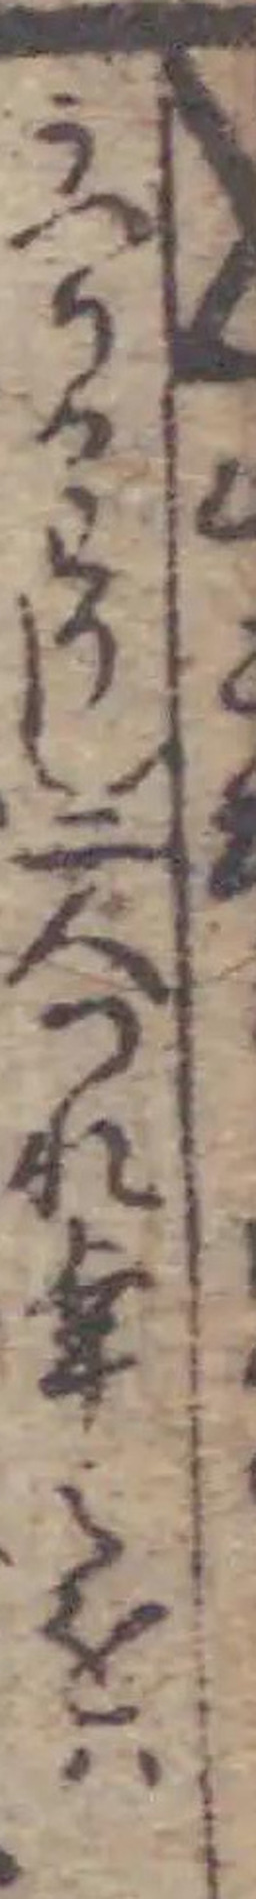うつりかわりし二人つれ幸之進は
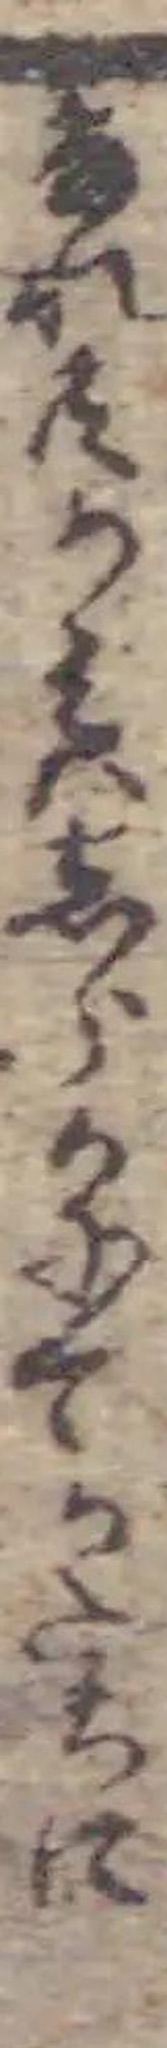なれ共かみはしらかにてかたちに
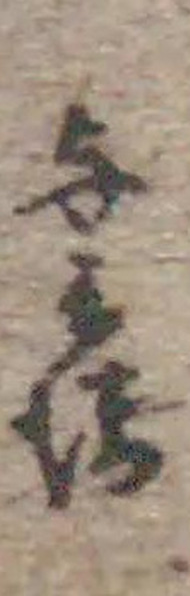与兵衛
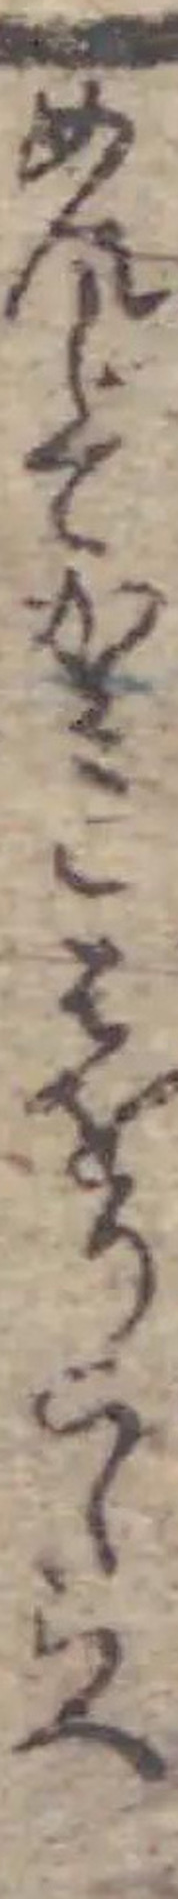めんじてかみこはをりこしらへ
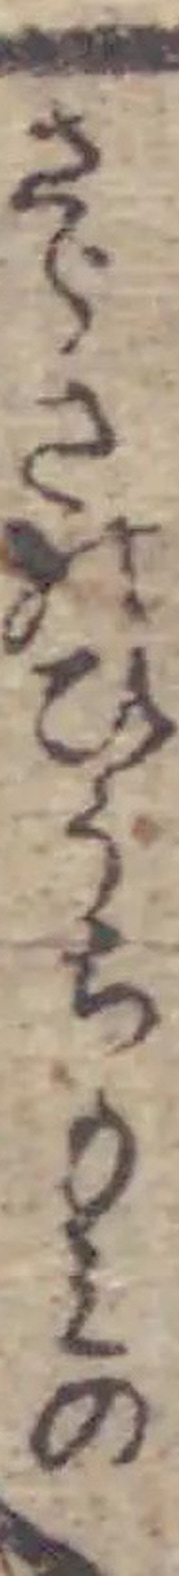さらさのひうちもみの
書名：日待御利生此ごろ噂 3巻
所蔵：国立国会図書館 National Diet Library, JAPAN
